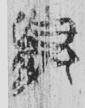擾
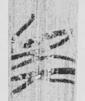矣
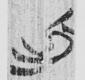此
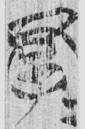君子
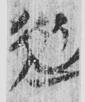從
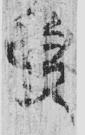事
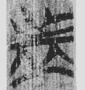者
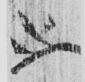之
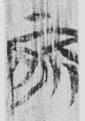所
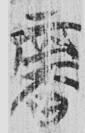啇（適）
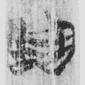廷
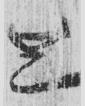也
